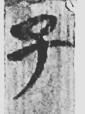子
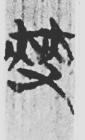{火火又}
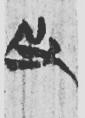及
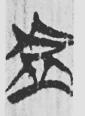者
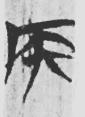侯
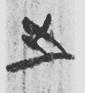之
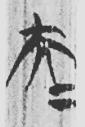夫=
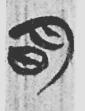明
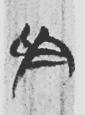於
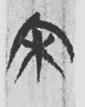宋
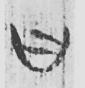曰
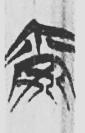爾
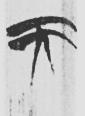天
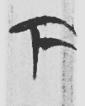下
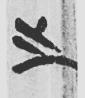之
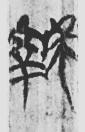{幸虎}
